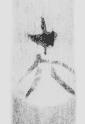{十六}
